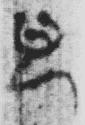也
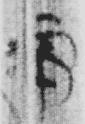不
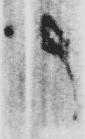又（有）
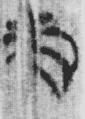夫
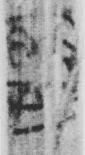恆
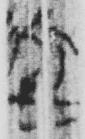○（忻）
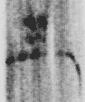之
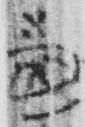志
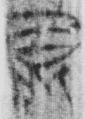鼎（則）
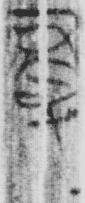曼（慢）
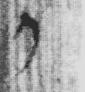人
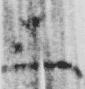之
